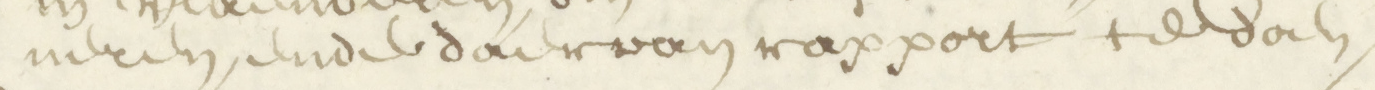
neren, ende daervan rapport te doen
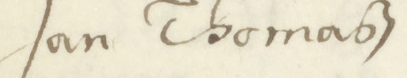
Jan Thomasz
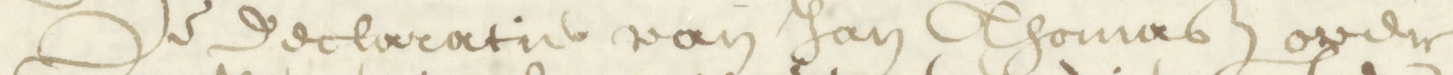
De declaratie van Jan Thomasz over
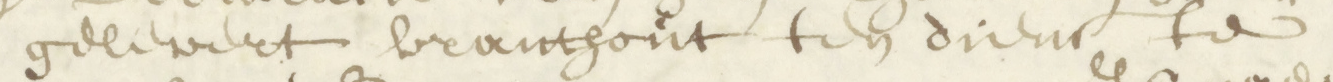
gelevert branthout, ten dienste
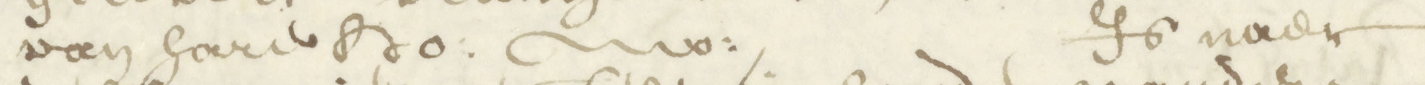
van hare Ho:Mo: is naer
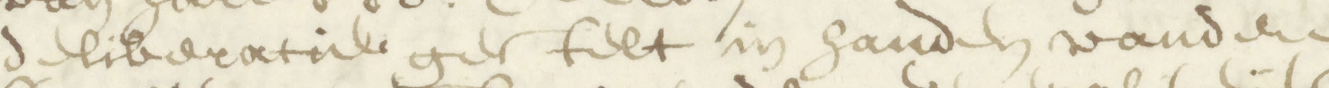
deliberatie gestelt in handen vanden
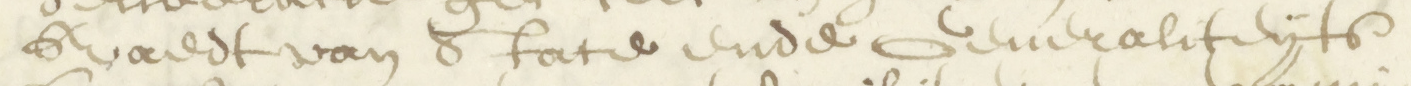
Raedt van State ende Generaliteijts
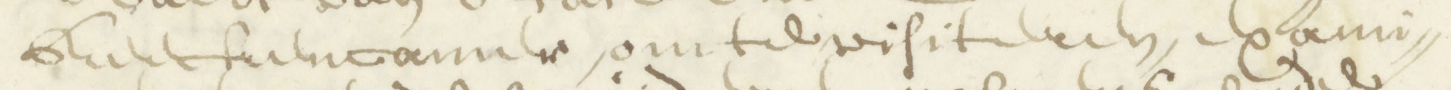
Reeckencamer, om te visiteren, exami,
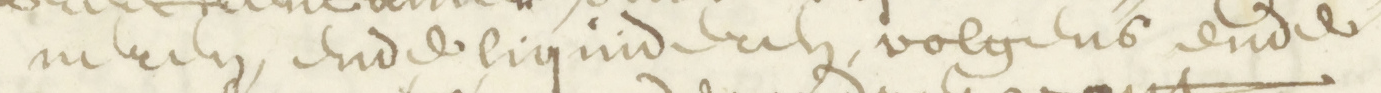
neren, ende liquideren volgens ende
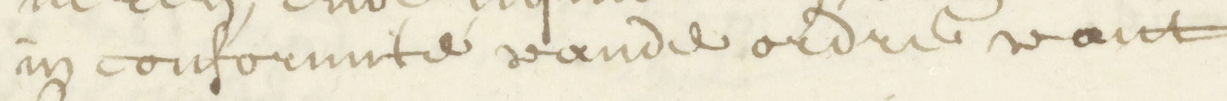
in conformité vande ordre vant
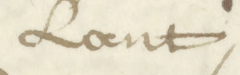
Lant.
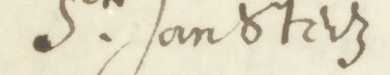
St. Janssteen
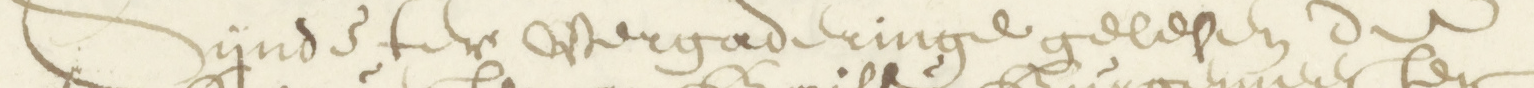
Sijnde ter Vergaderinge gelesen de
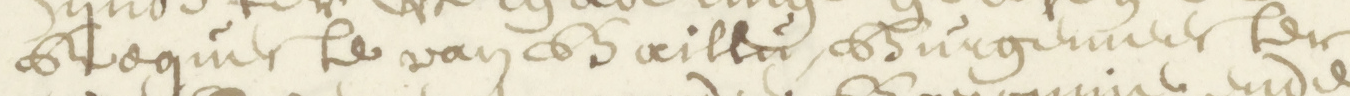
requeste van Baillu, Burgemeester
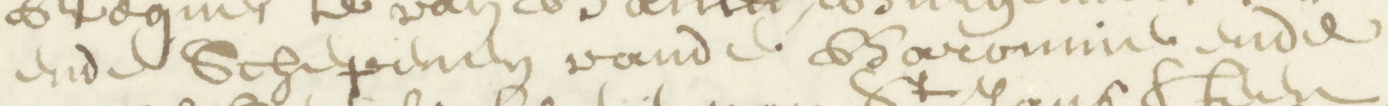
ende Schepenen vande Baronnie ende
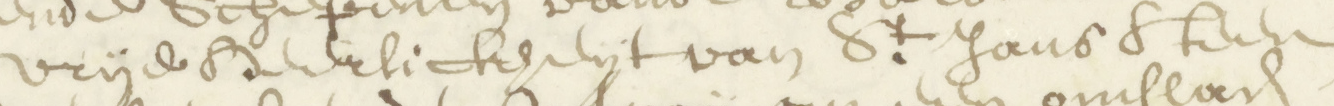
vrije Heerlickheijt van St. Janssteen
